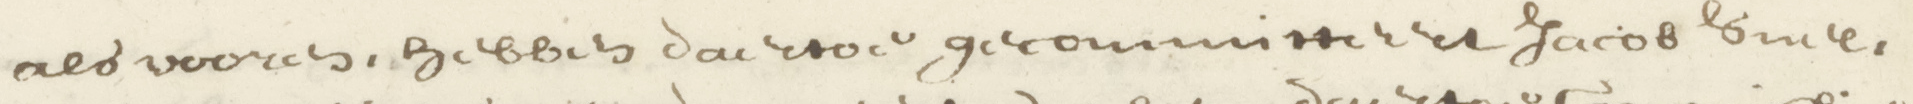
als vooren, hebben daertoe gecommitteert Jacob Snel.
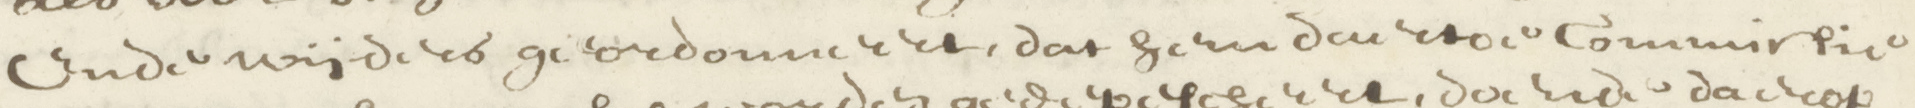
Ende wijders geordonneert, dat hem daertoe commissie
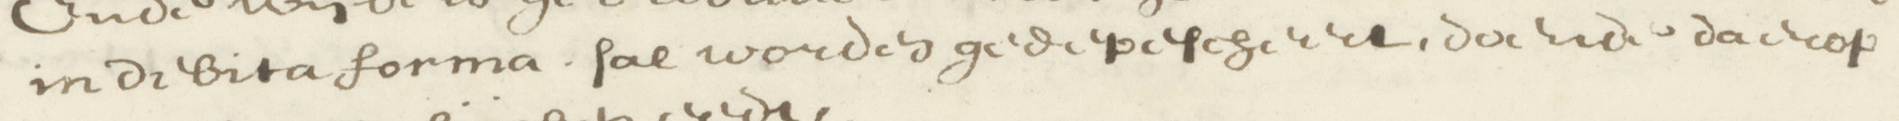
in debita forma sal worden gedepescheert, doende daerop
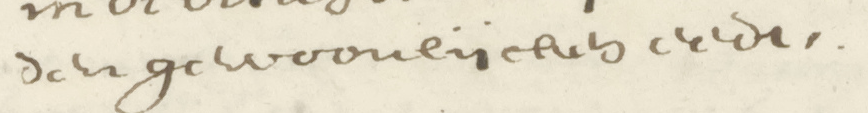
den gewoonlijcken eedt.
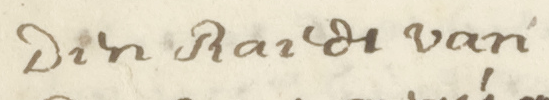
Den Raedt van
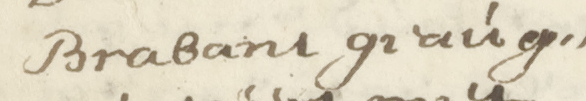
Brabant geaug„
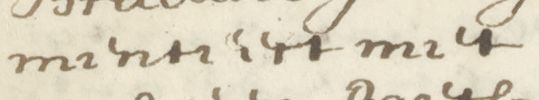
menteert met
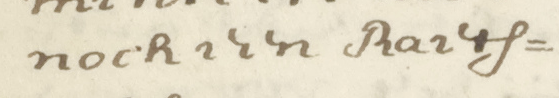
noch een Raets„
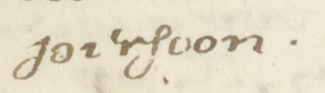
persoon.
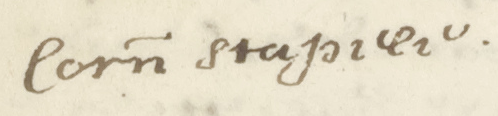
Corn. Stapele.
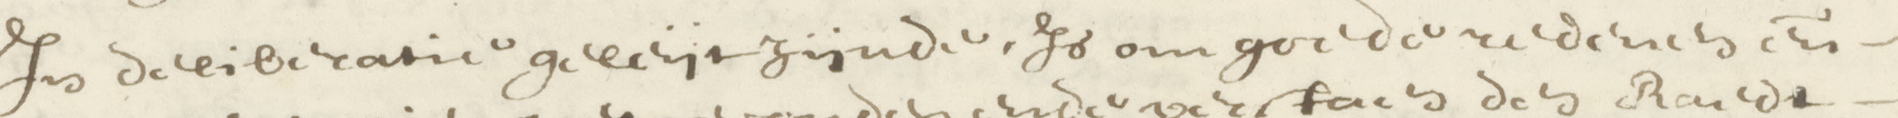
In deliberatie geleijt zijnde, Is om goede redenen en -
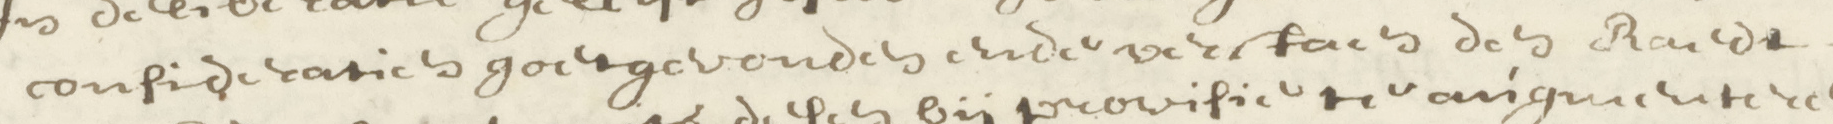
consideratien goetgevonden ende verstaen den Raedt
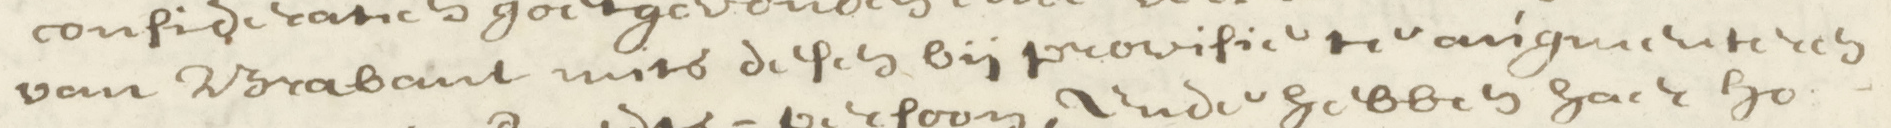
van Brabant mits desen bij provisie te augmenteren
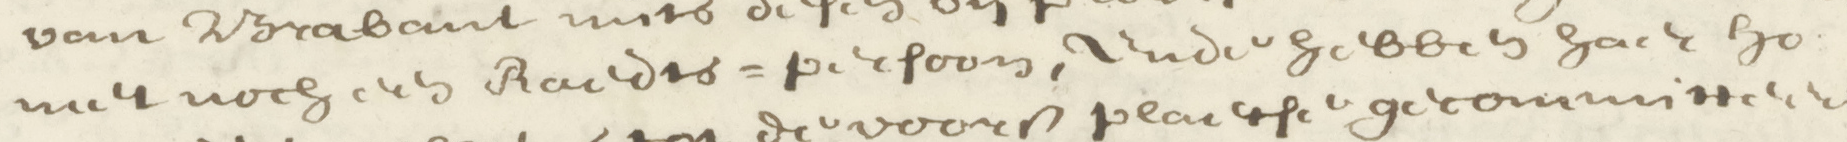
met noch een Raedts=persoon. Ende hebben haer Ho:
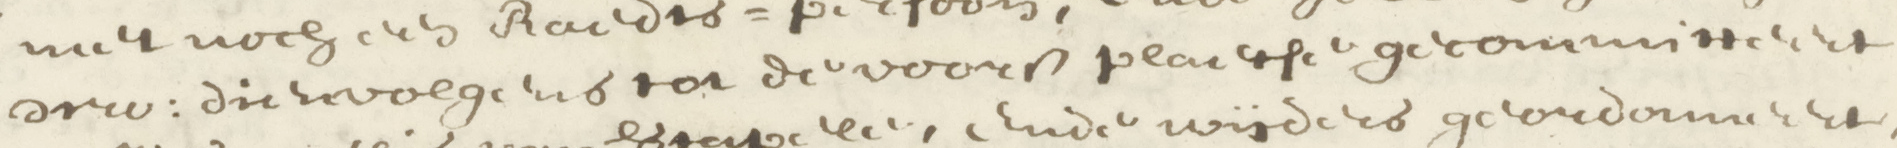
Mo: dienvolgens tot de voors plaetse gecommitteert
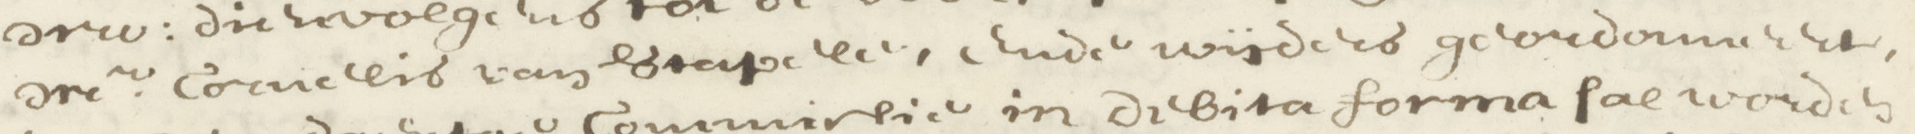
Mr Cornelis van Stapele, Ende wijders geordonneert,
